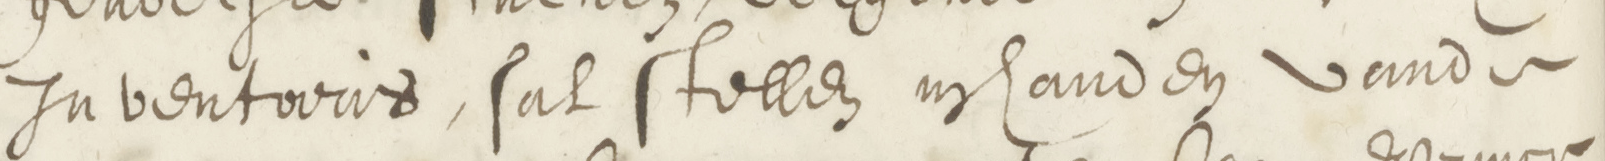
In ventaris, sal stellen in handen vande
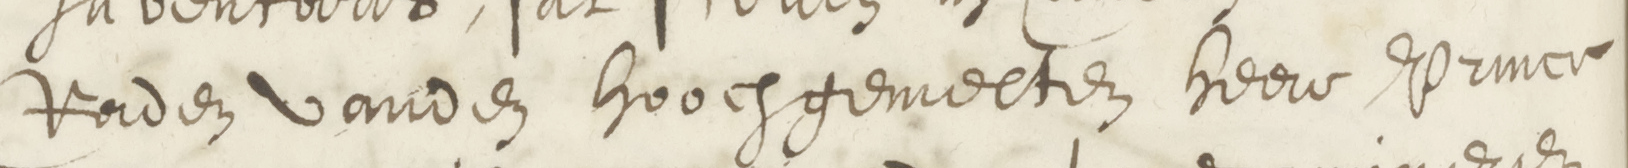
Raden vanden hoochgemelten heere Prince
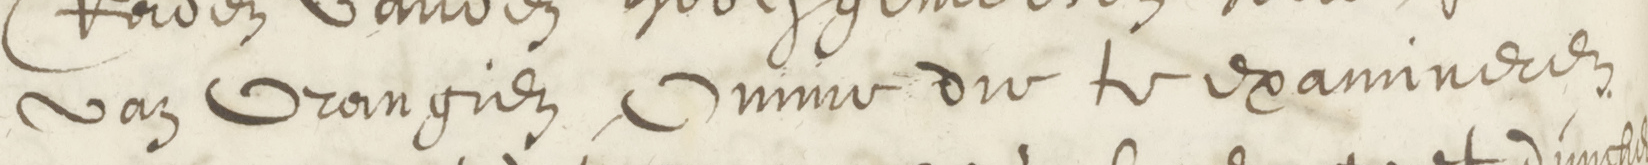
van Orangien, Omme die te examineren
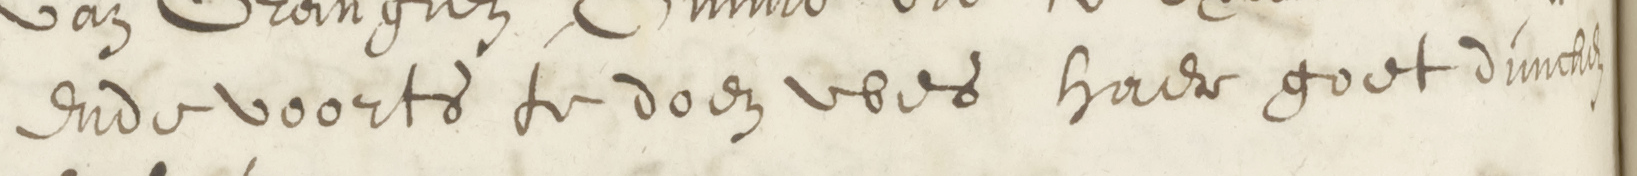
ende voorts te doen wes haer goet duncken
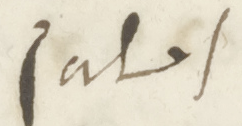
sal.
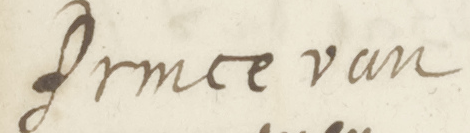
Prince van
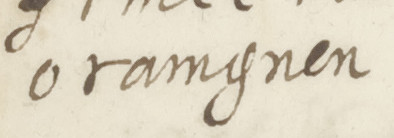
oraingnen
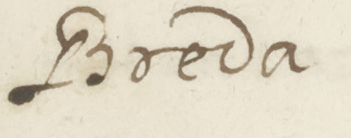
Breda
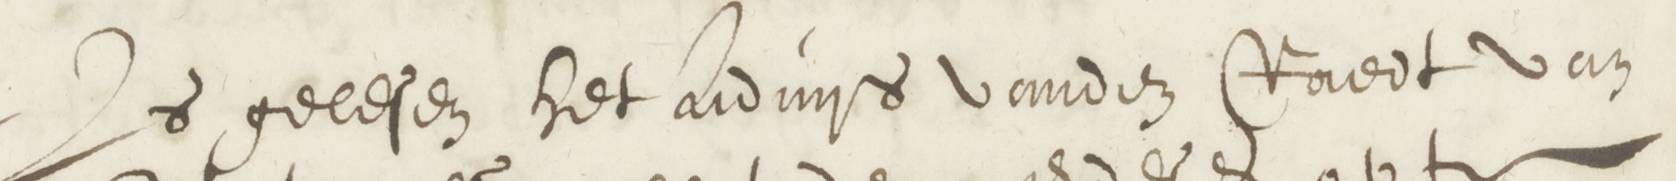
Is gelesen het Aduys vanden Raedt van
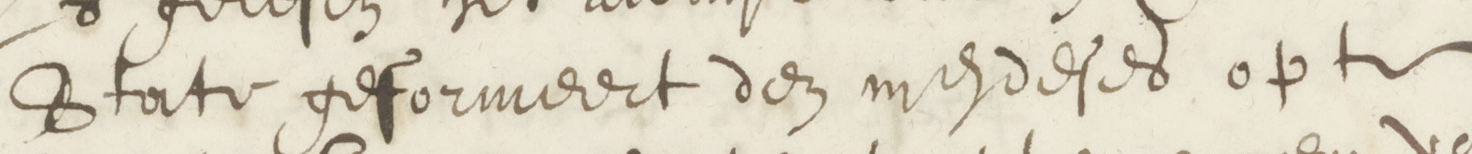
State geformeert den iiien deses opte
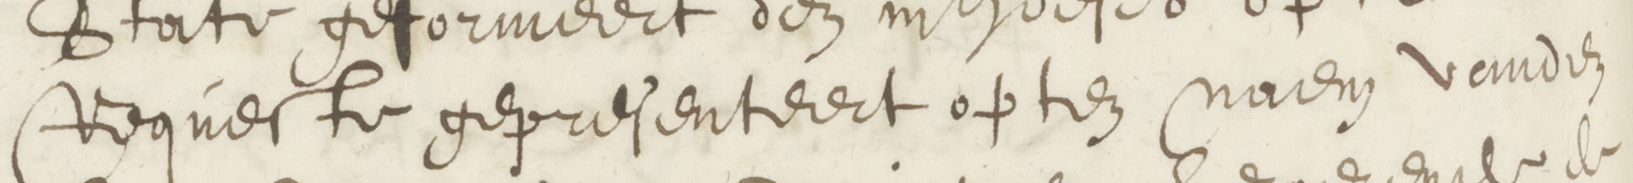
Requeste gepresenteert opten naem vanden
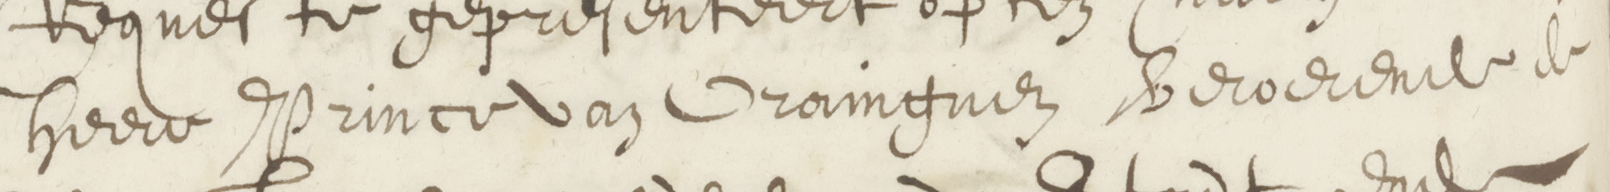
heere Prince van Oraingnen beroerende de
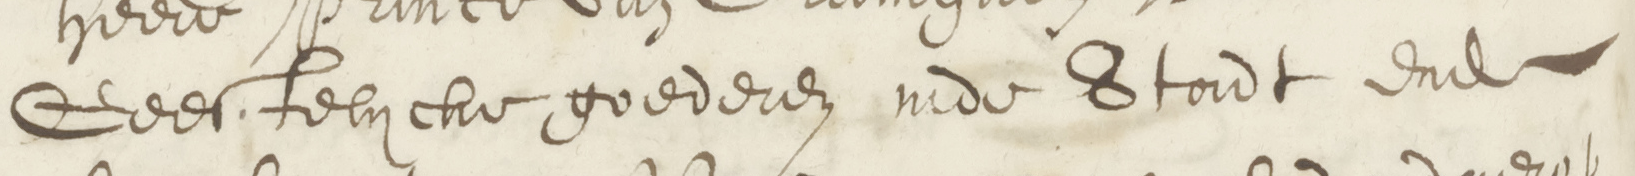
Geestelycke goederen inde Stadt ende
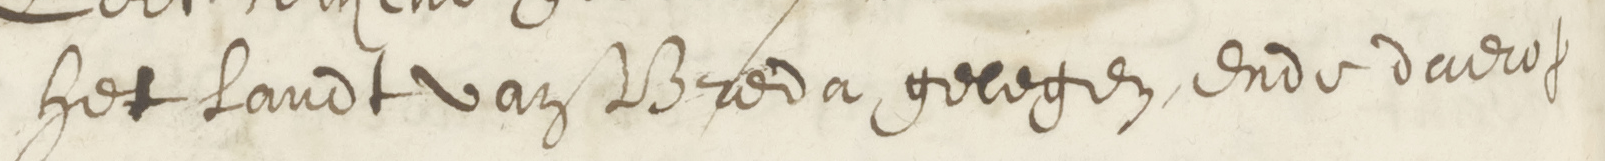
het Landt van Breda gelegen, ende daerof
